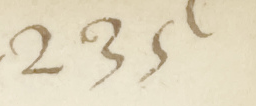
235
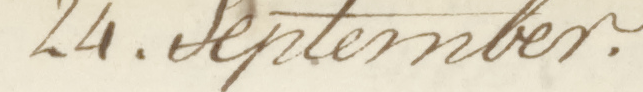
24. September.
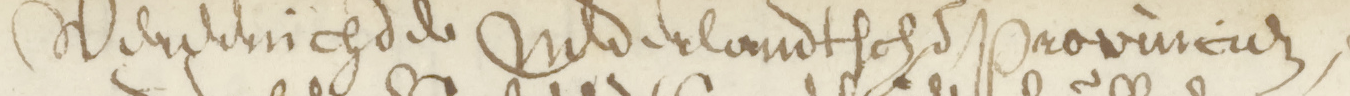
Vereenichde Nederlandtsche Provincien,
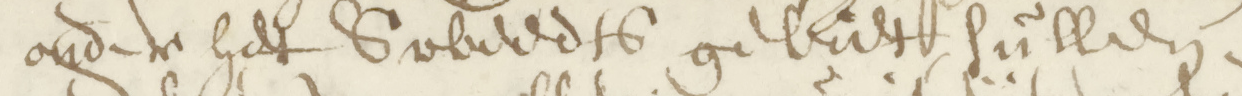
onder het Sweedts gebiet sullen
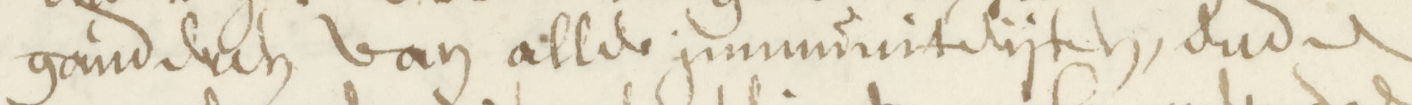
ganderen van alle immuniteijten, ende
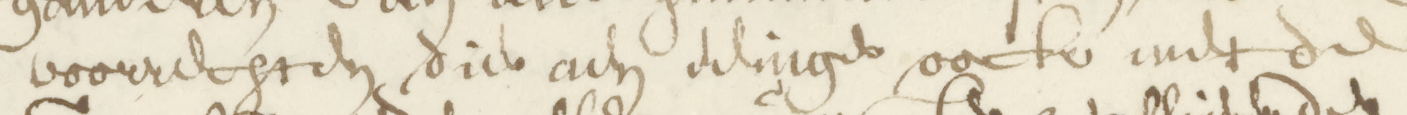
voorrechten, die aen eenige oock met de
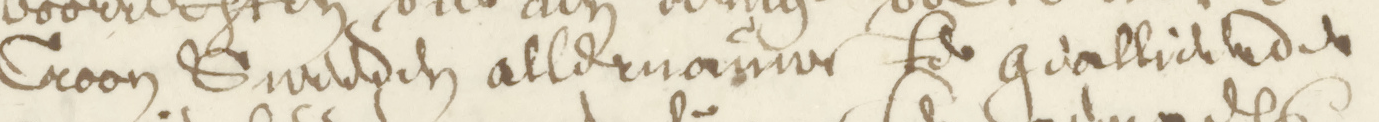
Croon Sweeden allernauwste geallieerde
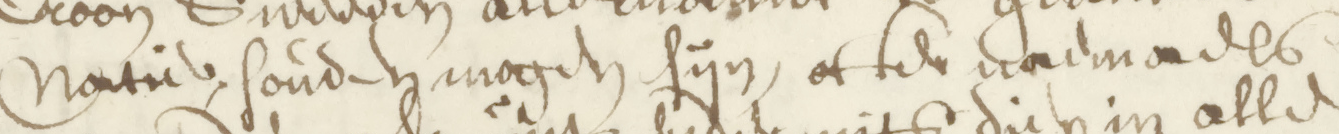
natie, souden mogen sijn, ofter naemaels
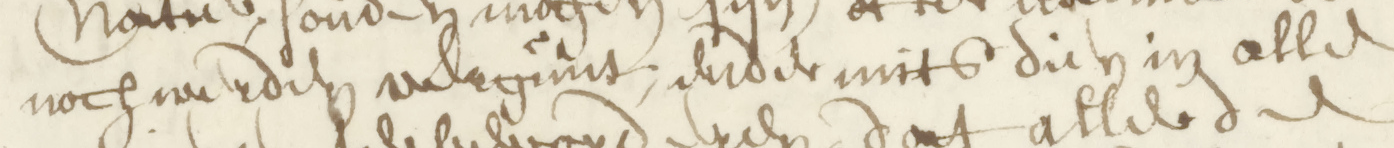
noch werden vergunt, ende mits dien in alle
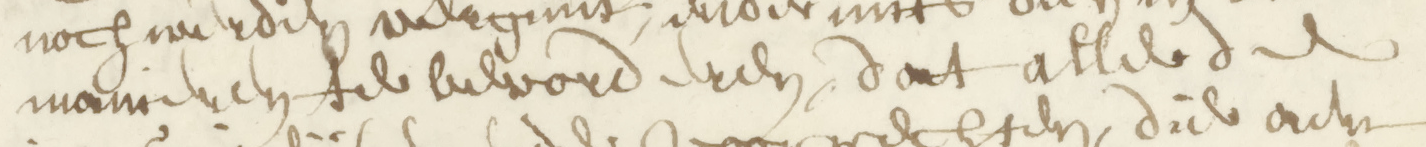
manieren te bevorderen, dat alle de
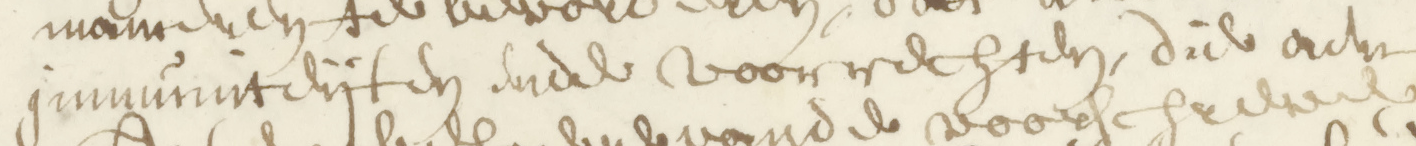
immuniteijten ende voorrechten, die aen
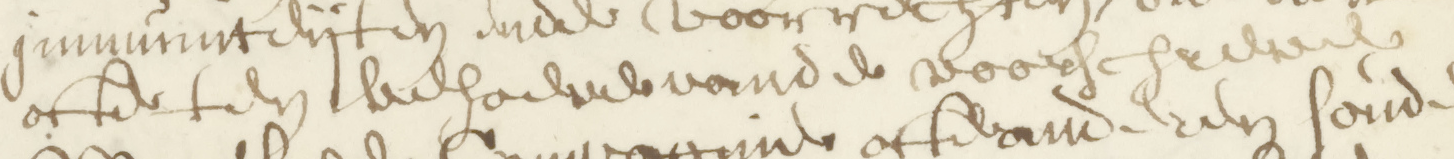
ofte ten behoeve vande voorschreve
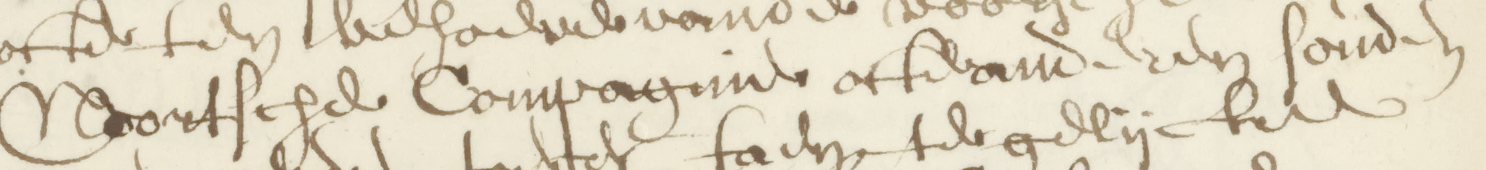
Noortsche Compagnie ofte anderen souden
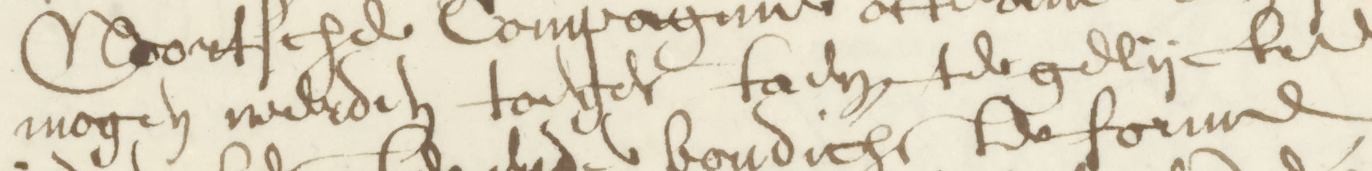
mogen werden toegestaen, te gelijcke
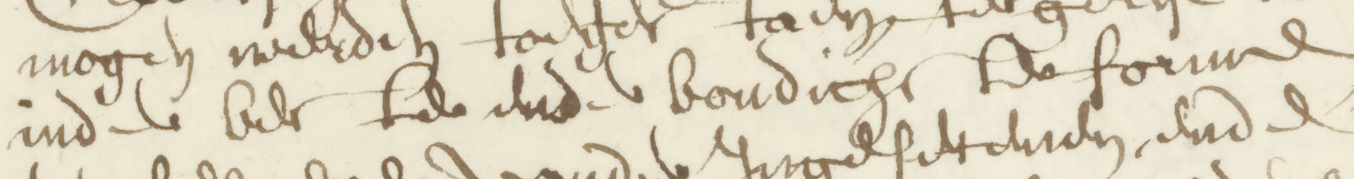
inde beste ende bondichste forme
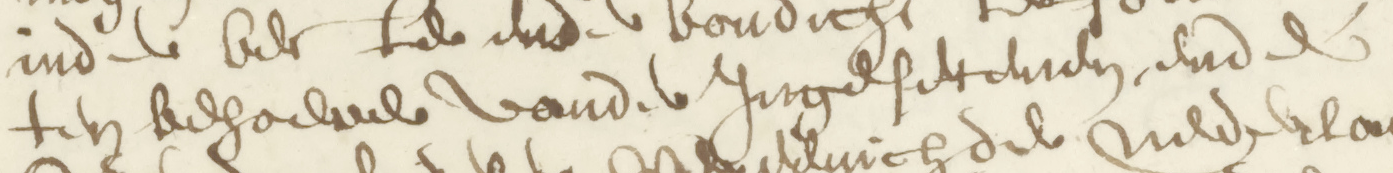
ten behoeve vande Ingesetenen, ende
